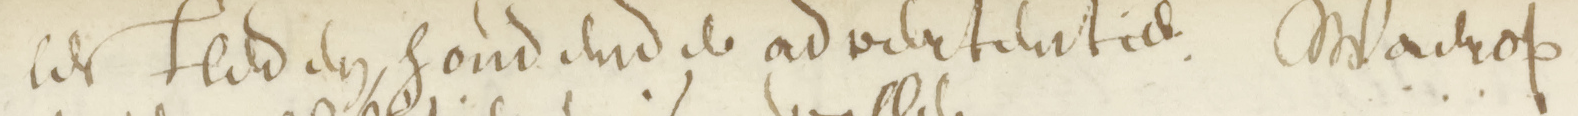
lestleden, houdende advertentie. Waerop
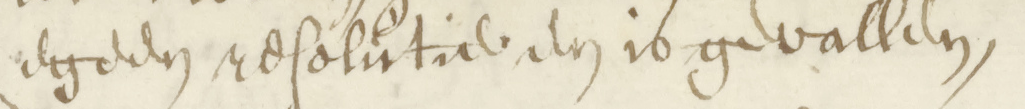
egeen resolutie en is gevallen.
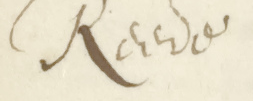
Reede
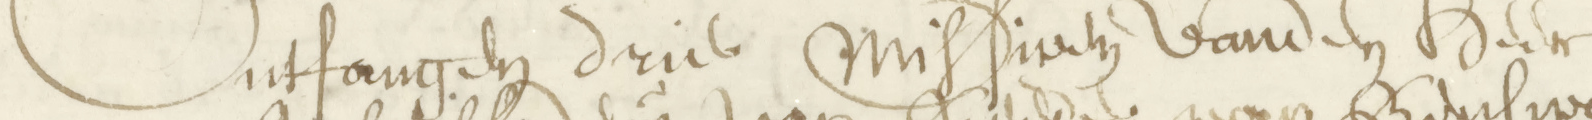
Ontfangen drie missiven vanden Heer
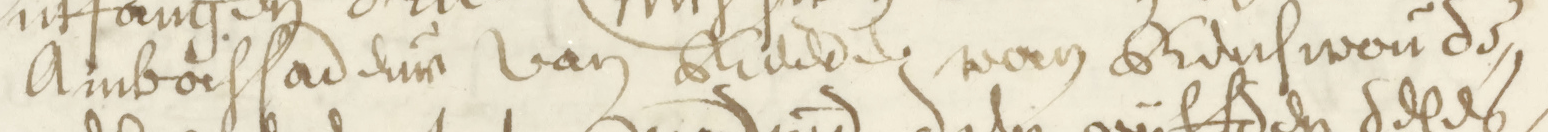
Ambassadeur van Reede van Renswoude,
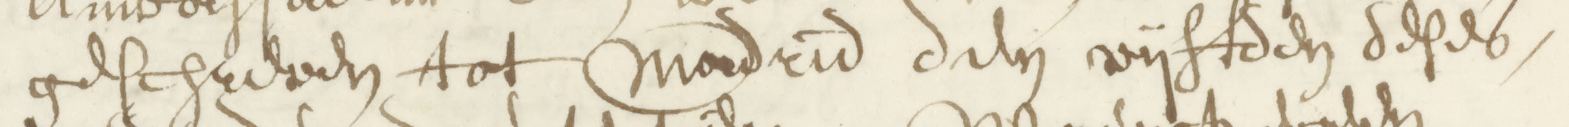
geschreven tot Madrid den vijffden deses,
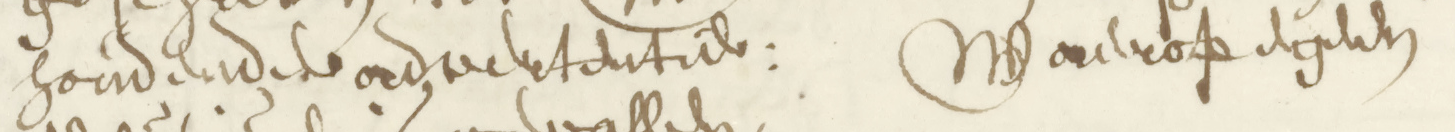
houdende advertentie: Waerop egeen
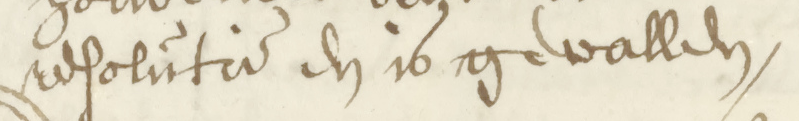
resolutie en is gevallen.
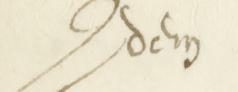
Idem
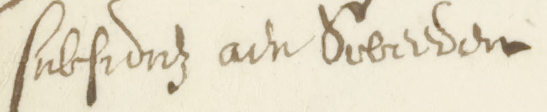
subsidien aen Sweeden
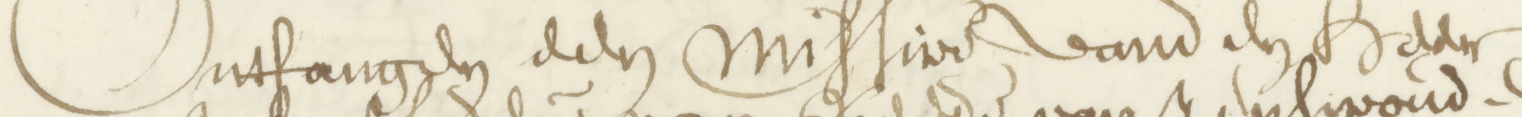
Ontfangen een missive vanden Heer
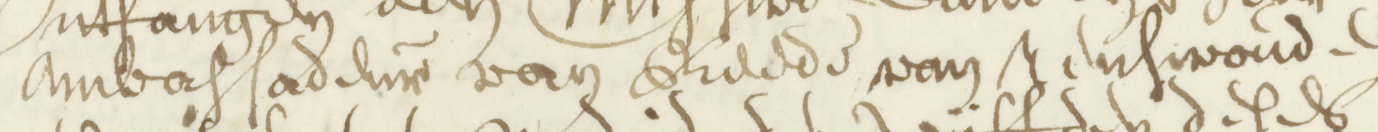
ambassadeur van Reede van renswoude
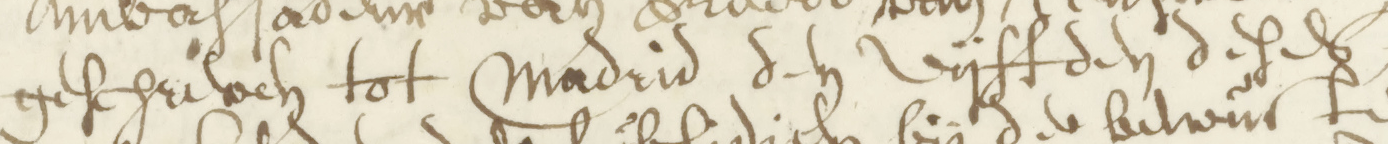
geschreven tot Madrid den vijffden deses
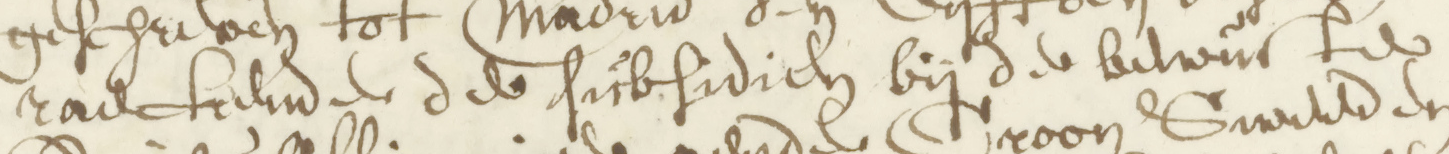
raeckende de subsidien bij de bewuste
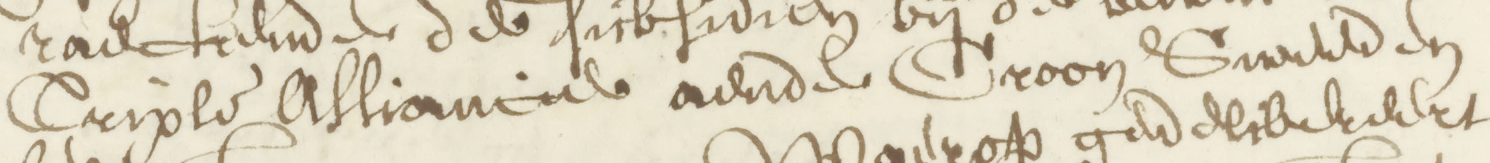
Triple Alliancie aende Croon Sweeden
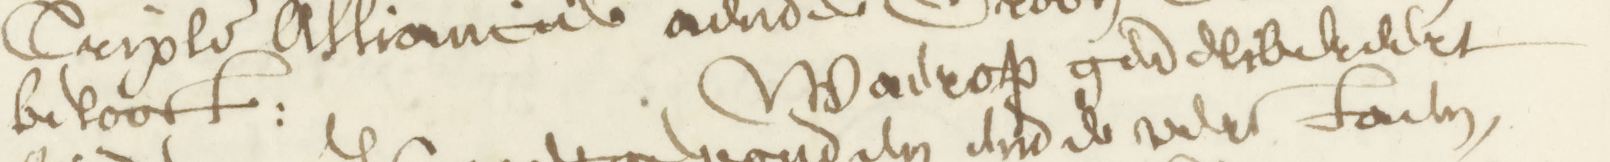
belooft: Waerop gedelibereert
